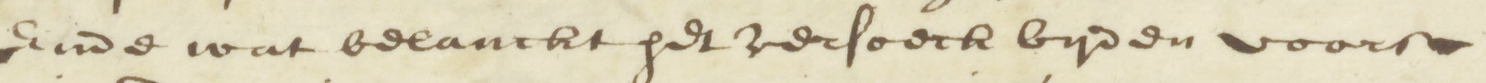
Ende wat belanckt het versoeck by den voorsz
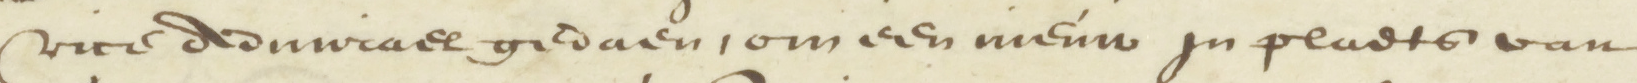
vice Admirael gedaen, om een nieuw in plaets van
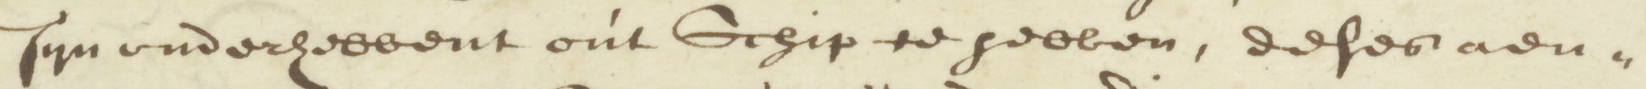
syn onderhebbent out Schip te hebben, deses aen„
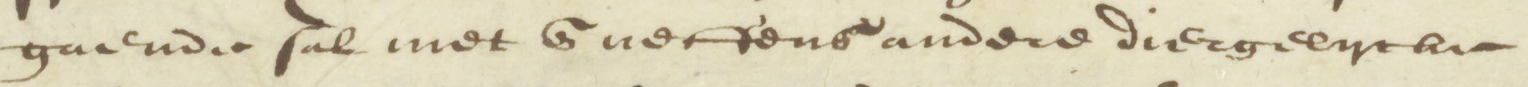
gaende sal met en neffens andere diergelycke
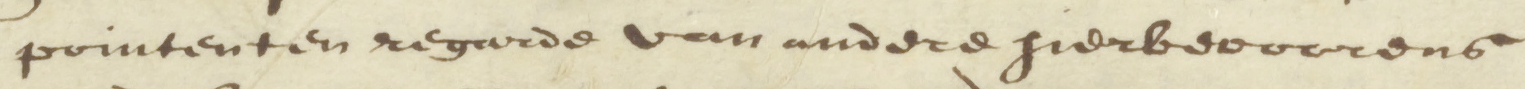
pointen ten regarde van andere hierbevoorens
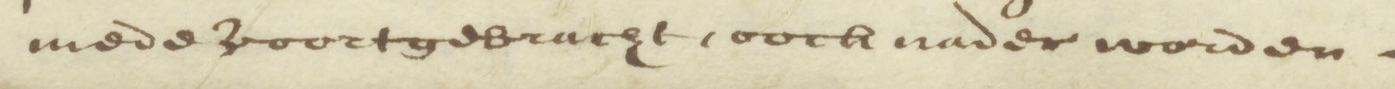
mede voortgebracht, oock nader worden —
